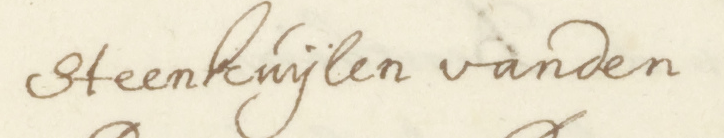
Steenkuijlen vanden
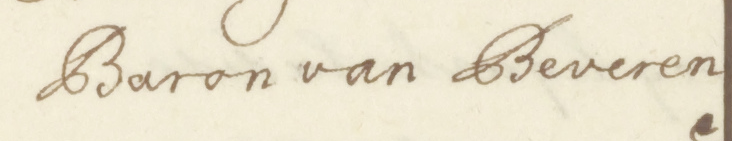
Baron van Beveren
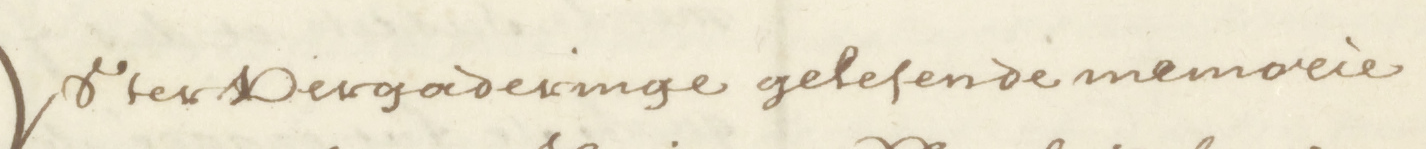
Is ter vergaderinegn gelesen de memorie
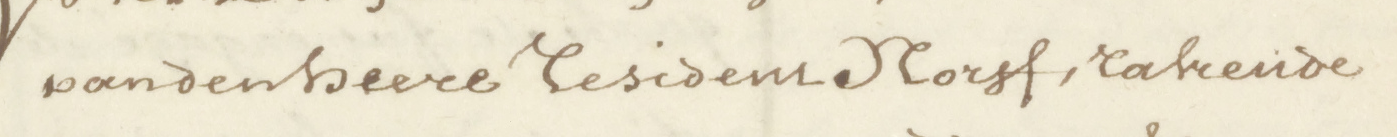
van den heere Resident Norff, rakende
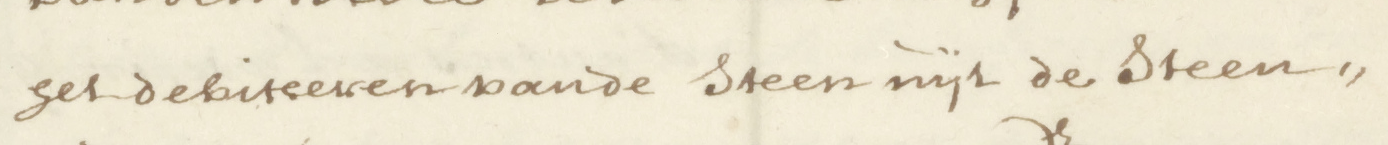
het debiteeren vande steen uijt de steen„
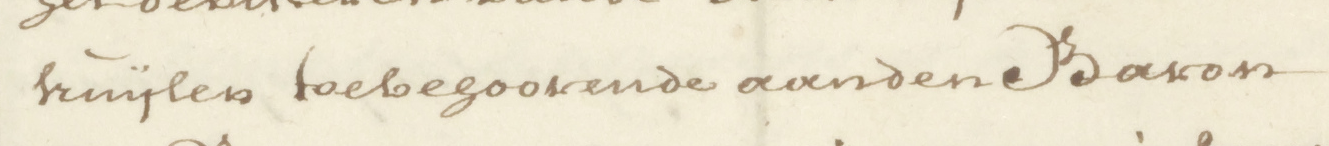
kuijlen toebehoorende aanden Baron
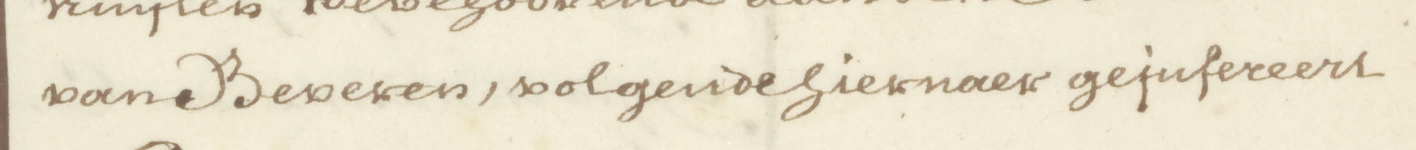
van Beveren, volgende hiernaer geinsereert
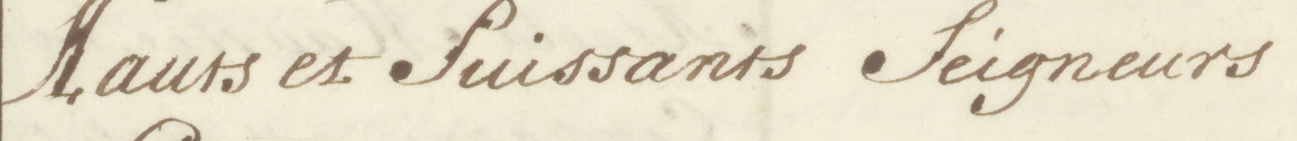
Hauts et Puissants Seigneurs
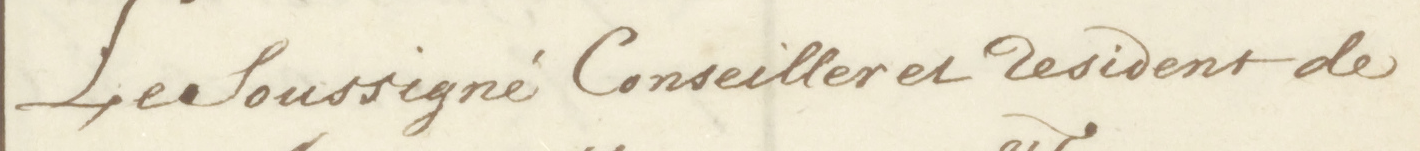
Les sousigné Conseiller et Resident de
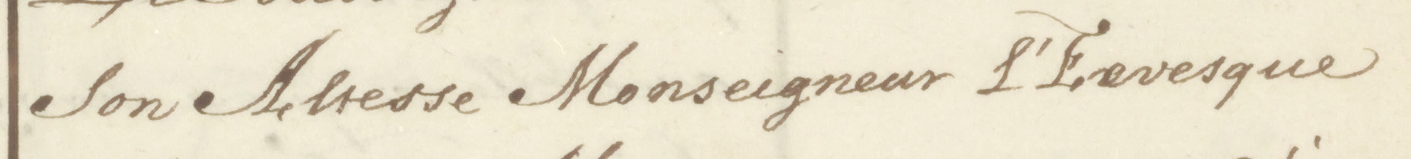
Son Altesse Monseigneur l'Evesque
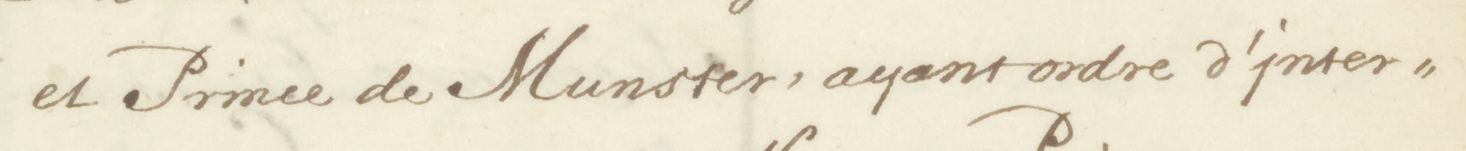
et Prince de Munster, ayant ordre d'inter„
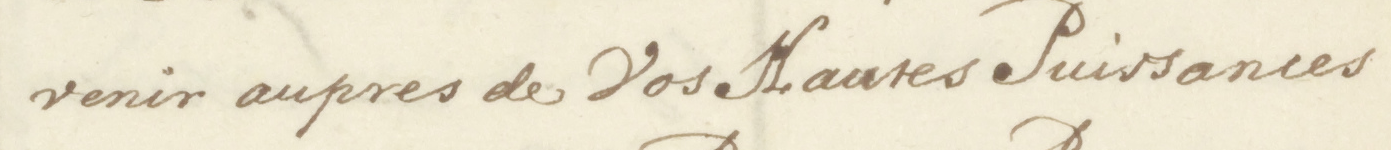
venir aupres de Vos Hautes Puissances
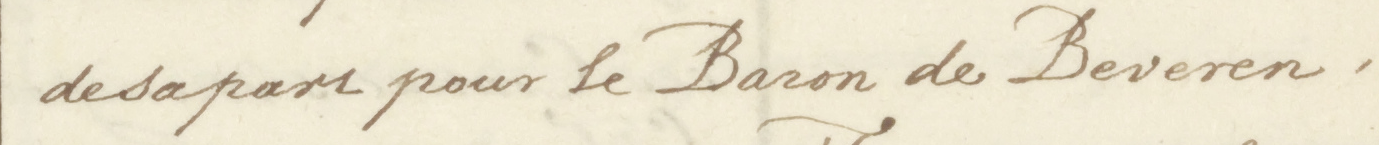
desapart pour le Baron de Beveren
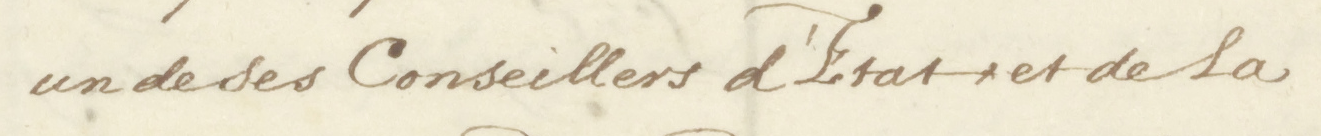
un de ses Conseillers d'Etat, et de la
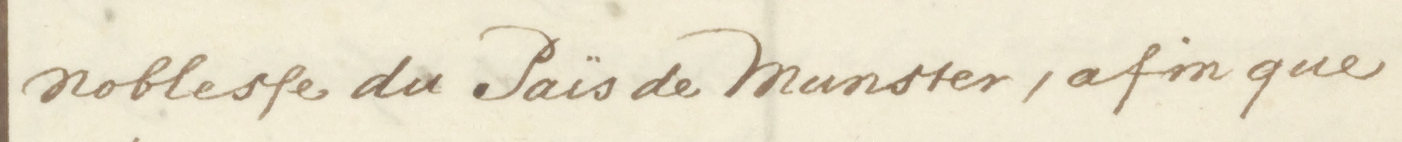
noblesse du Païs de Munster, afin que
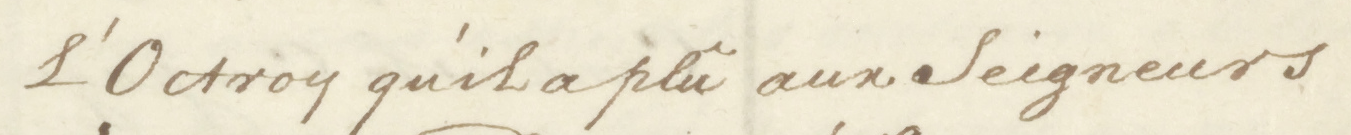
l'Octroy qu'il a plu aux Seigneurs
